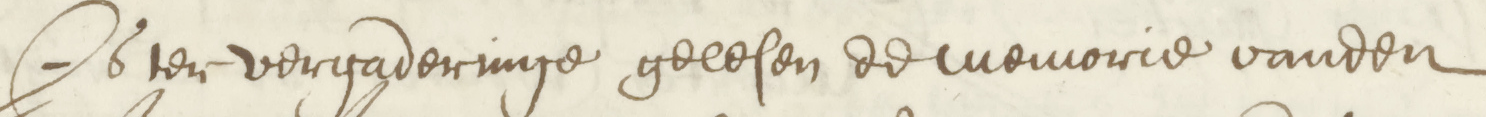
Is ter vergaderinge gelesen de memorie vanden
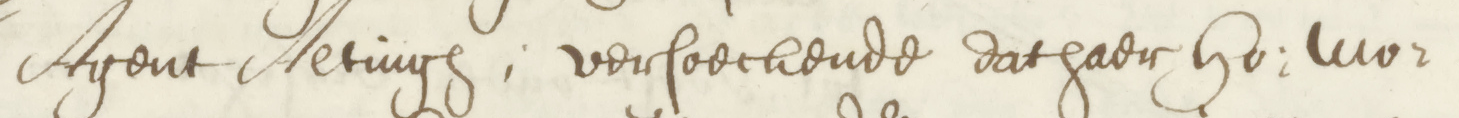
Agent Altingh, versoeckende dat haer Ho:mo:
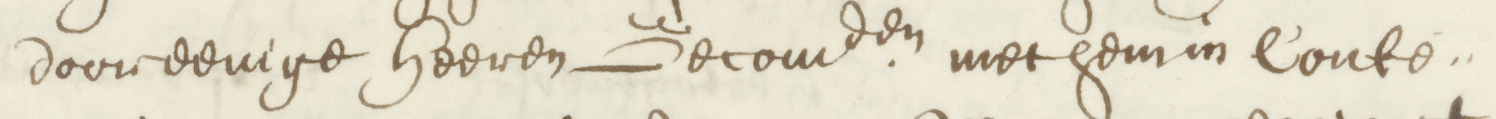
door eenige heeren Gecomden met hem in confe,,
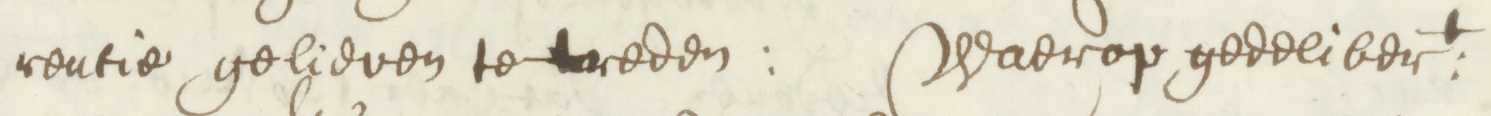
rentie gelieven te treden: Waerop gedelibert:
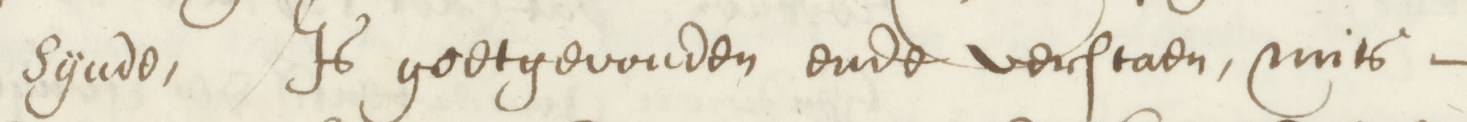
sijnde, Is goetgevonden ende verstaen, mits
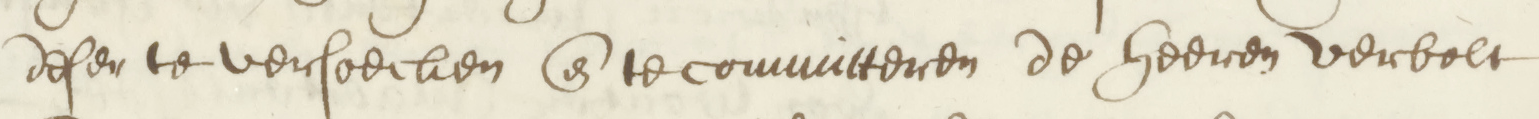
desen te versoecken & te committeren de heeren Verbolt
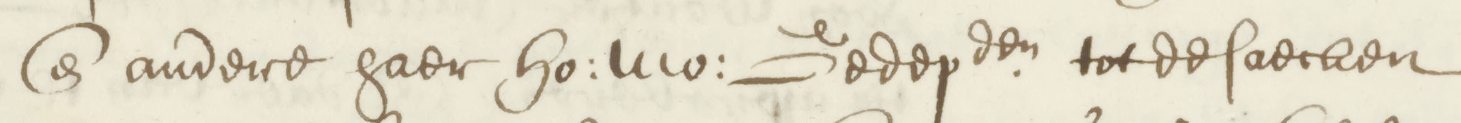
& andere haer Ho:mo: Gedepden tot de saecken
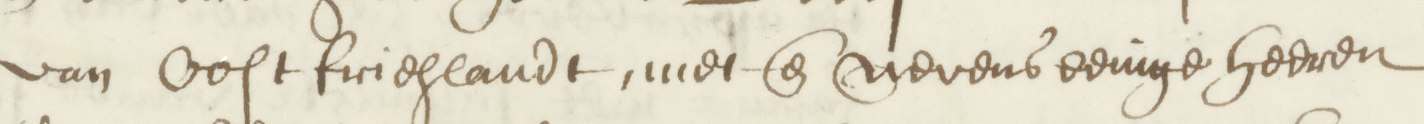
van Oostfrieslandt, met & nevens eenige heeren
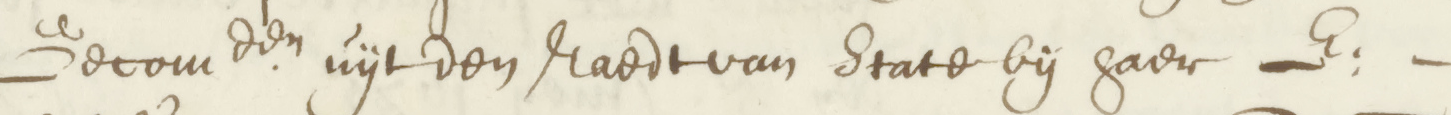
Gecomden uijt den raedt van State bij haer E:
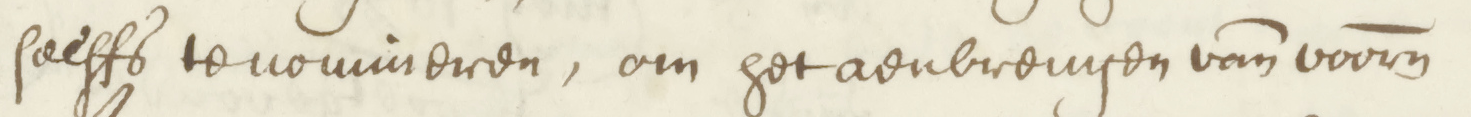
selffs te nomineren, om het aenbrengen van voorn
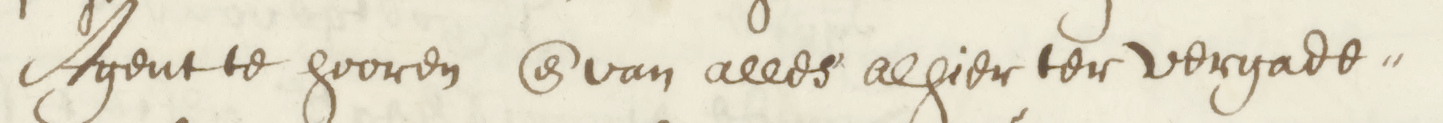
Agent te hooren & van alles alhier ter vergade„
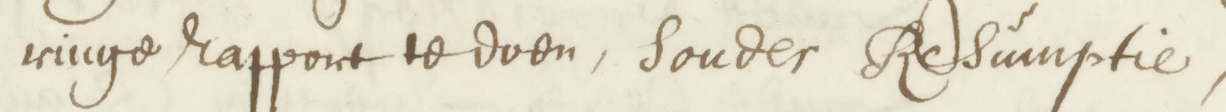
ringe rapport te doen, sonder Resumptie.
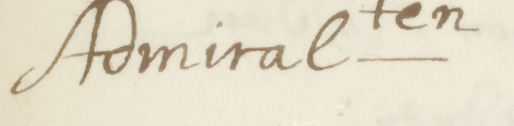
Admiralten
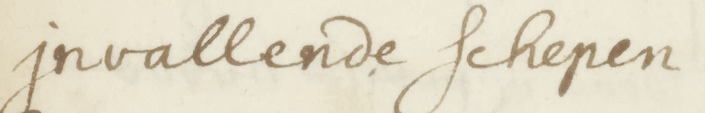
invallende schepen
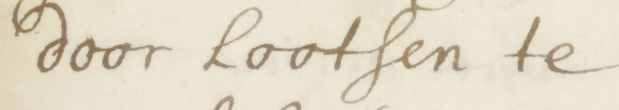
door Lootsen te
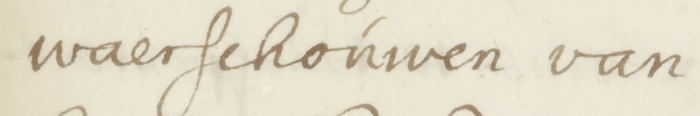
waerschouwen van
